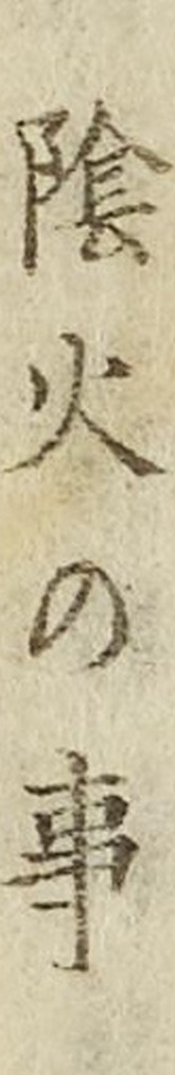陰火の事
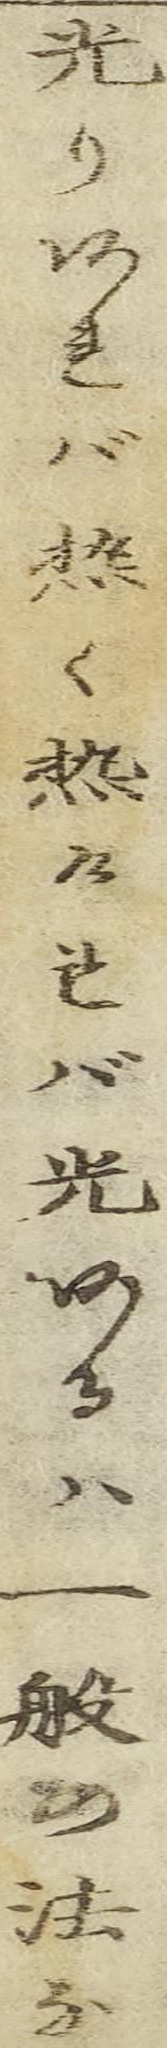光りあれば熱く熱ければ光あるは一般の法な

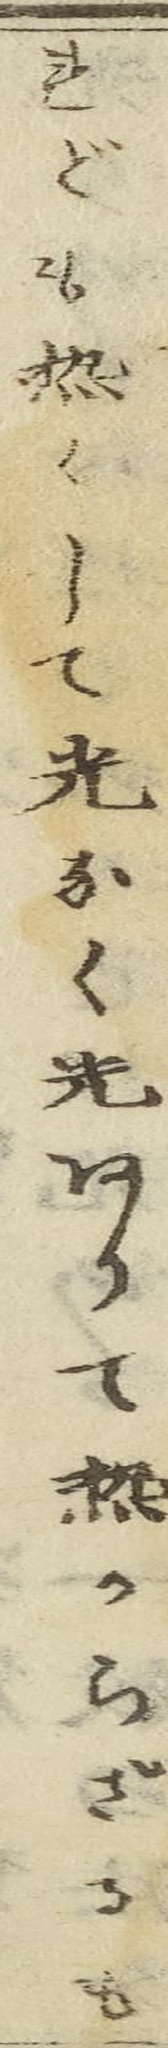れども熱くして光なく光ありて熱からざるも
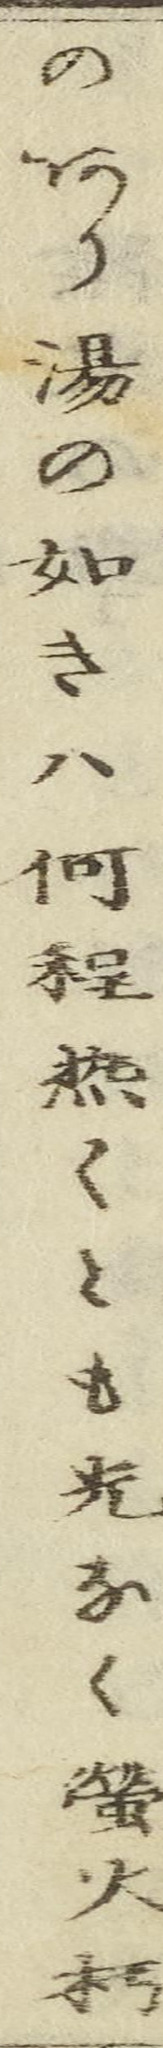のあり湯の如きは何程熱くとも光なく蛍火朽
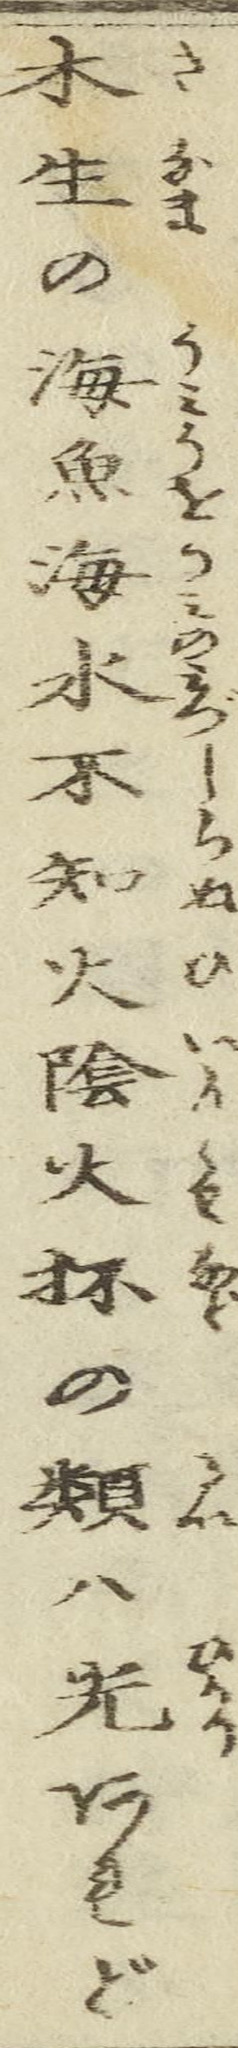木生の海魚海水不知火陰火抔の類は光あれど
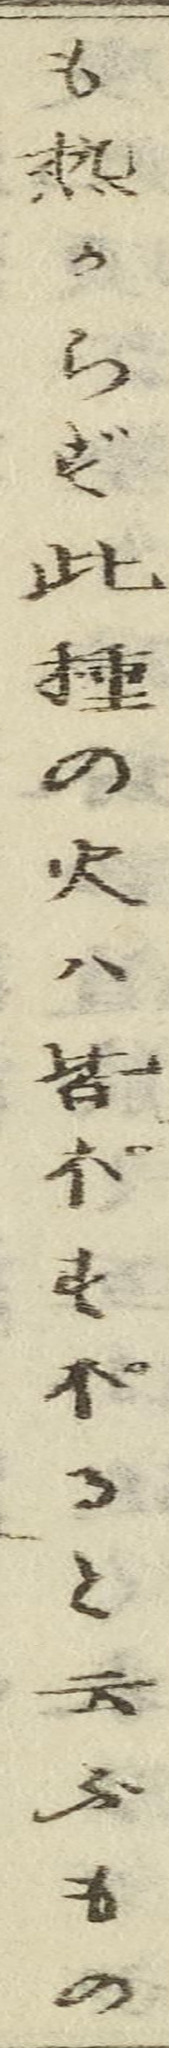も熱からず此種の火は皆「ぽすぽる」と云ふもの
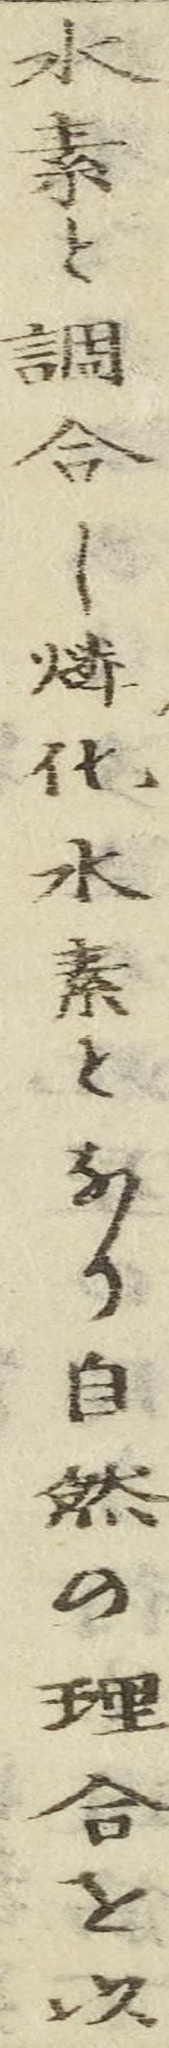水素と調合し燐化水素となり自然の理合を以
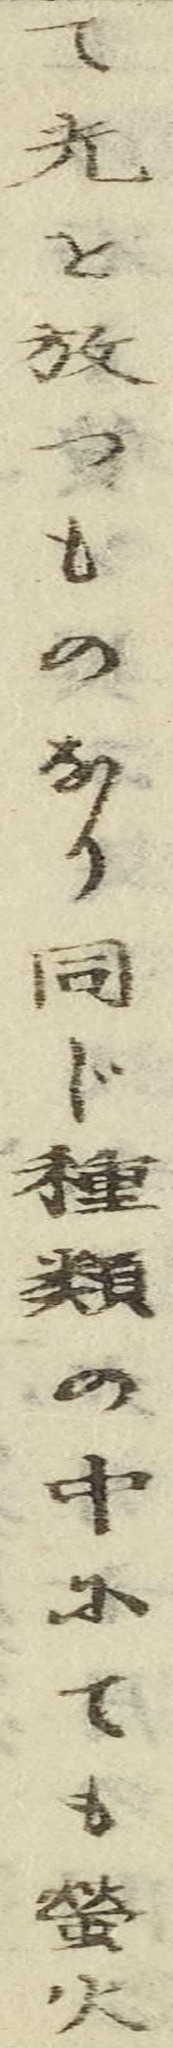て光を放つものなり同じ種類の中にても蛍火
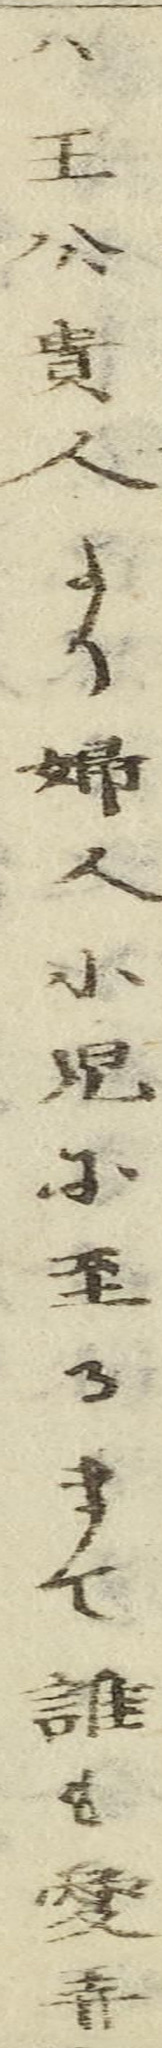は王公貴人より婦人小児に至るまて誰も愛弄
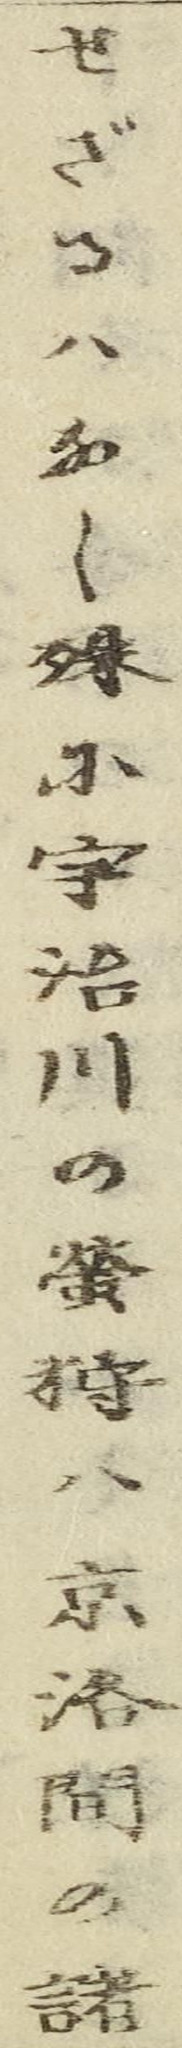せざるはなし殊に宇治川の蛍狩は京洛間の諸
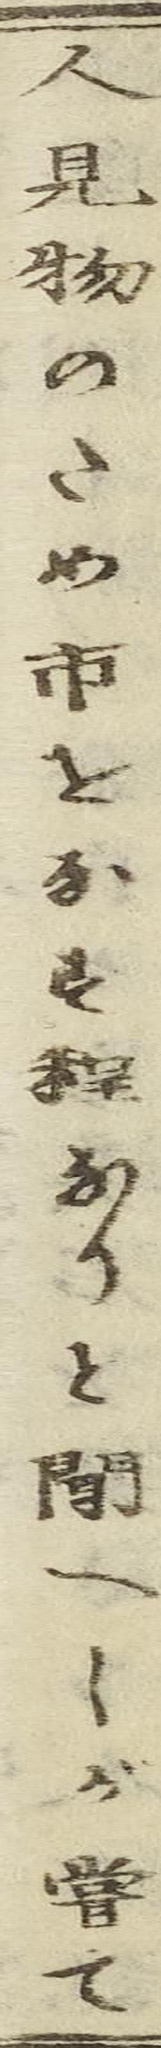人見物のため市をなす程なりと聞へしが嘗て
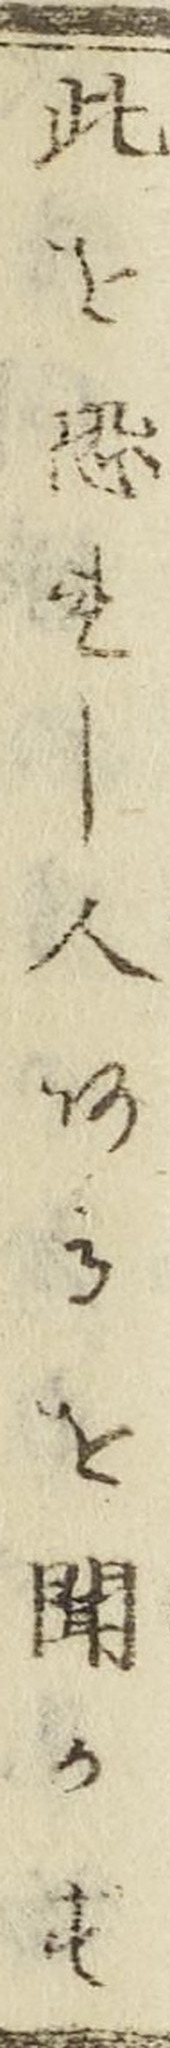此を恐れし人あるを聞かず
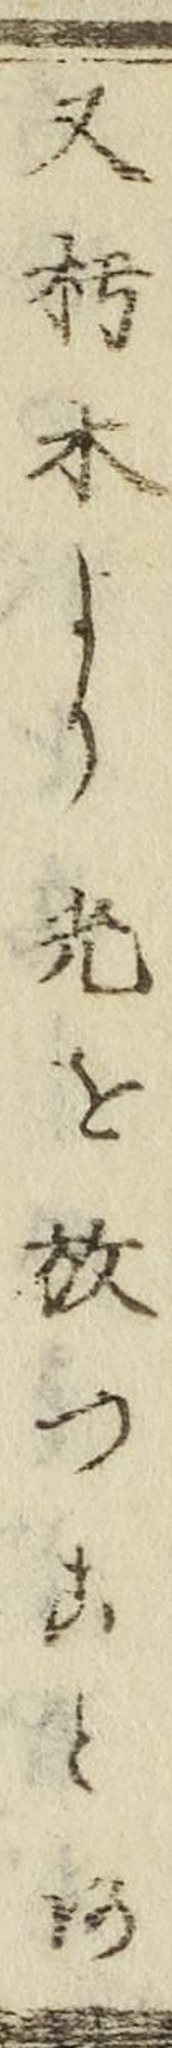又朽木より光を放つことあ
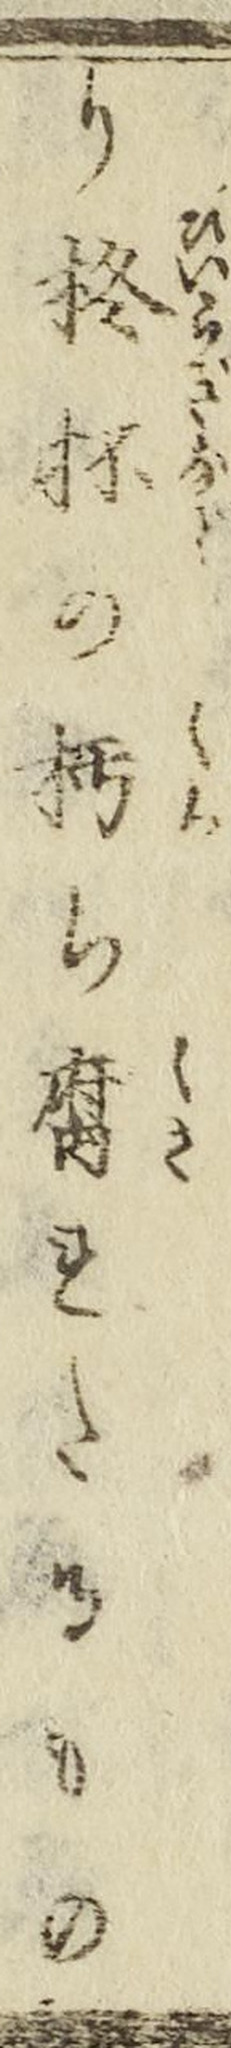り柊抔の朽ち腐れたるもの
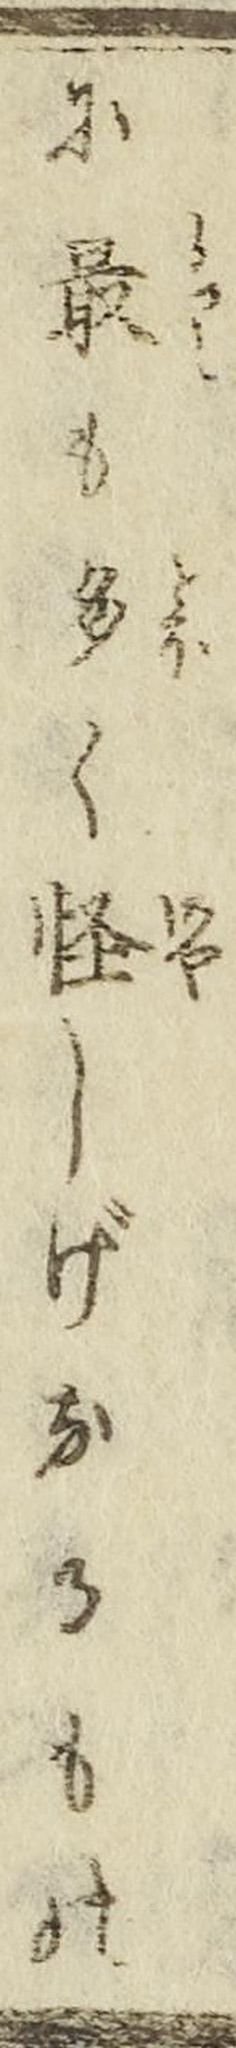に最も多く怪しげなるもの
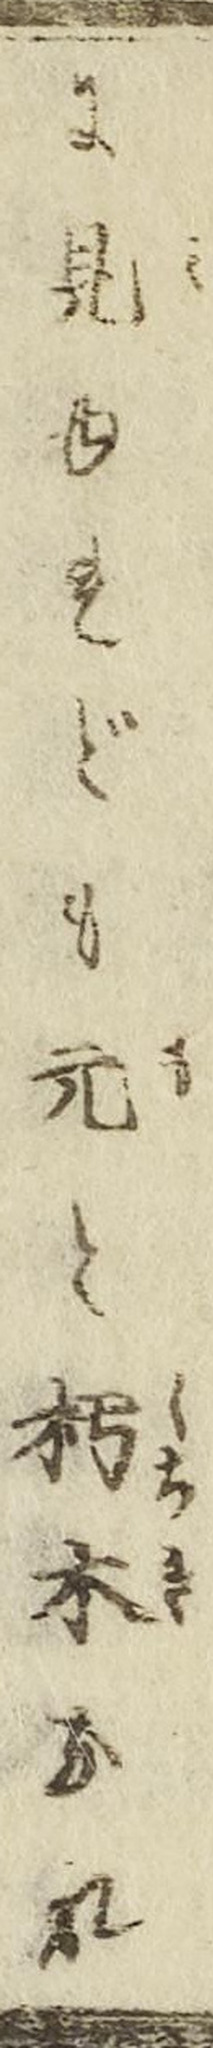に見ゆれども元と朽木なれ
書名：天変地異
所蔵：東京大学地震研究所図書室 Earthquake Research Institute Library, The University of Tokyo, JAPAN
